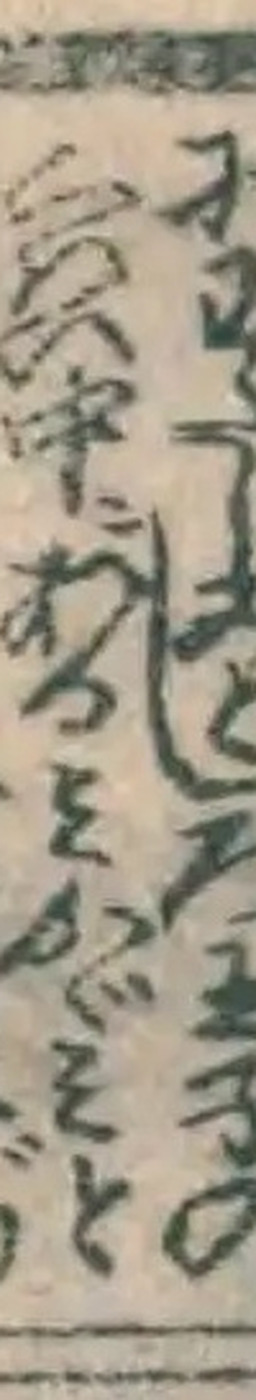くはい中にあるみかゞみと
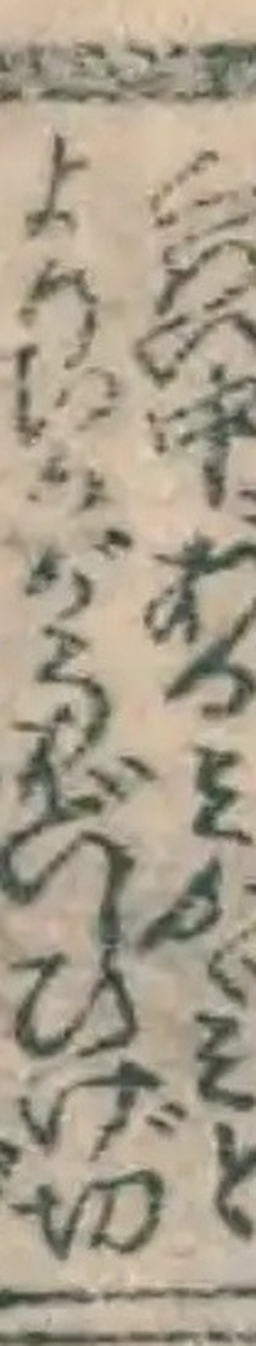よりちかがうばいしひげ切
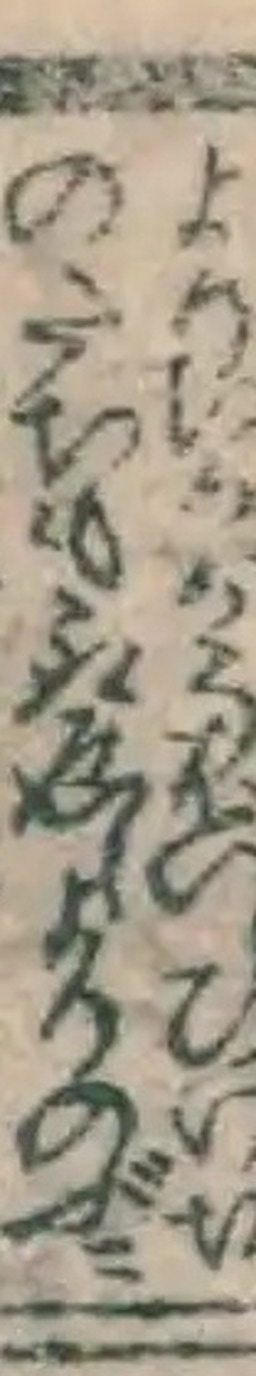のたちも取返しよりのぶに
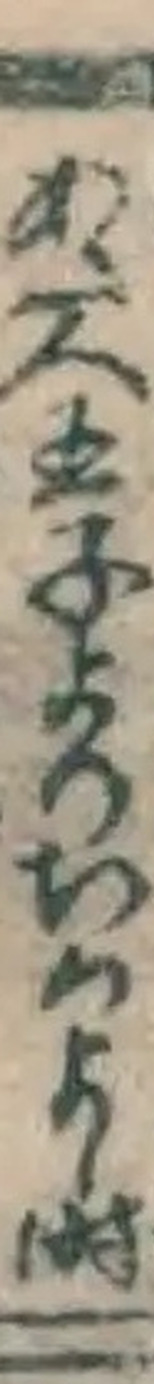あたへ王子よりちかよし時
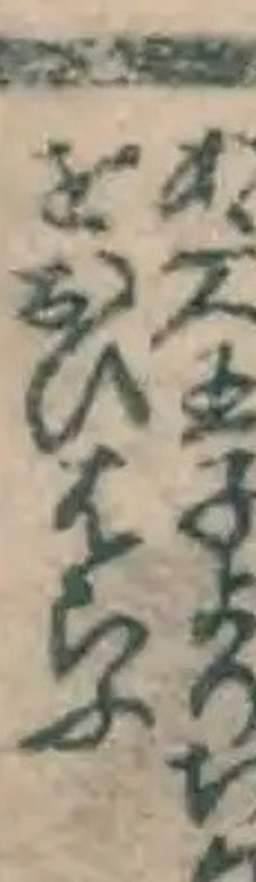をおひはらふ
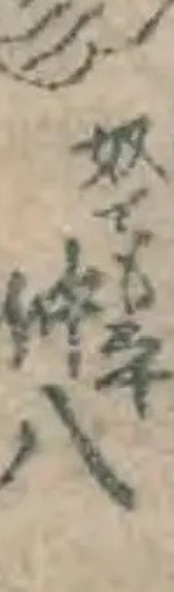奴ても平

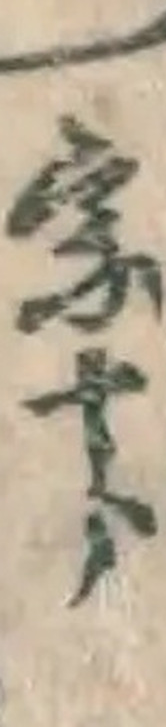宗十郎
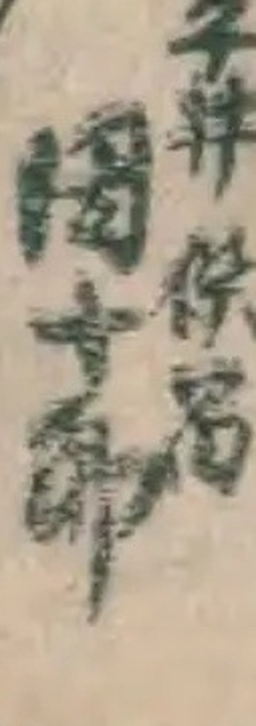宗十郎
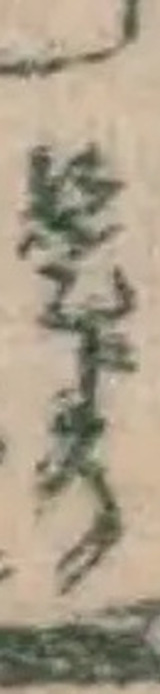是より
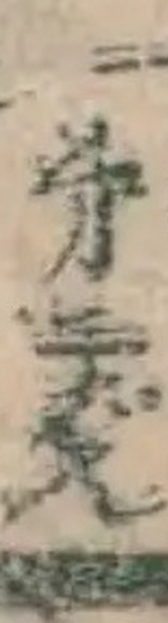第二ばん
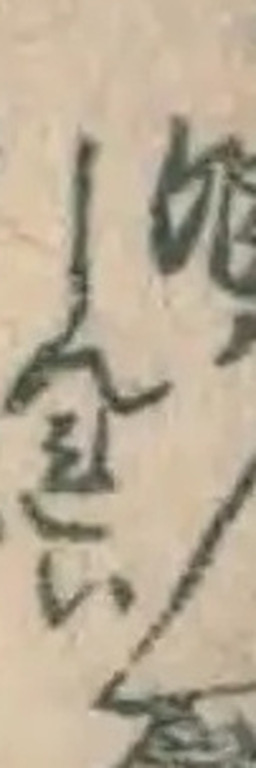しんれい
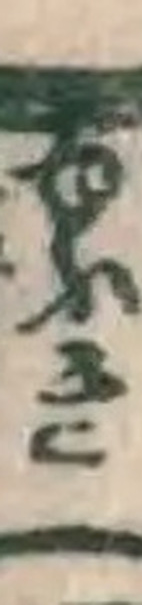ゆふき
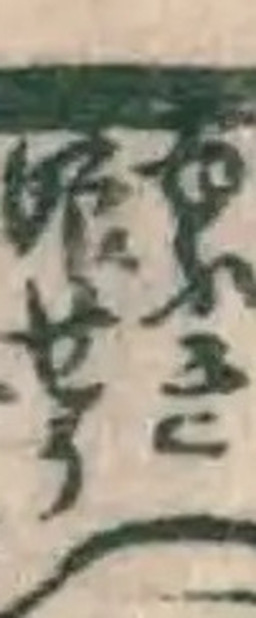娘せう
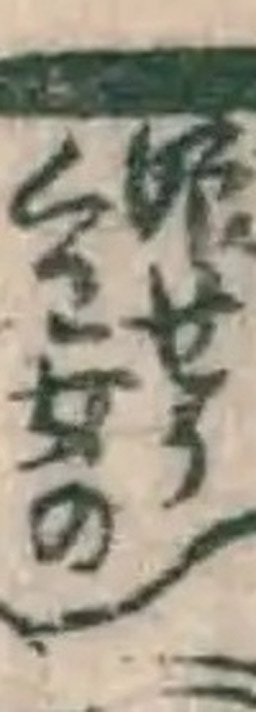くわ女の
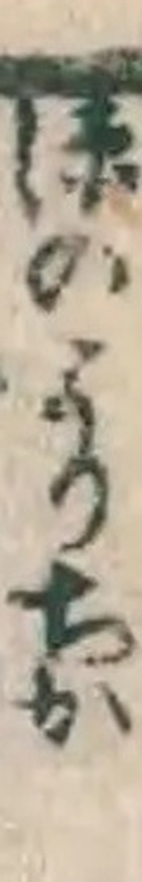源のよりちか
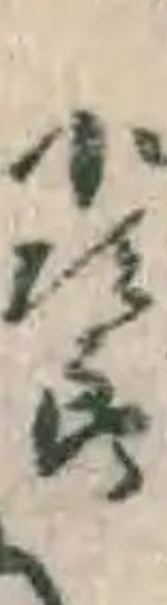小次郎
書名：四天王宿直着綿
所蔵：国立国会図書館 National Diet Library, JAPAN
